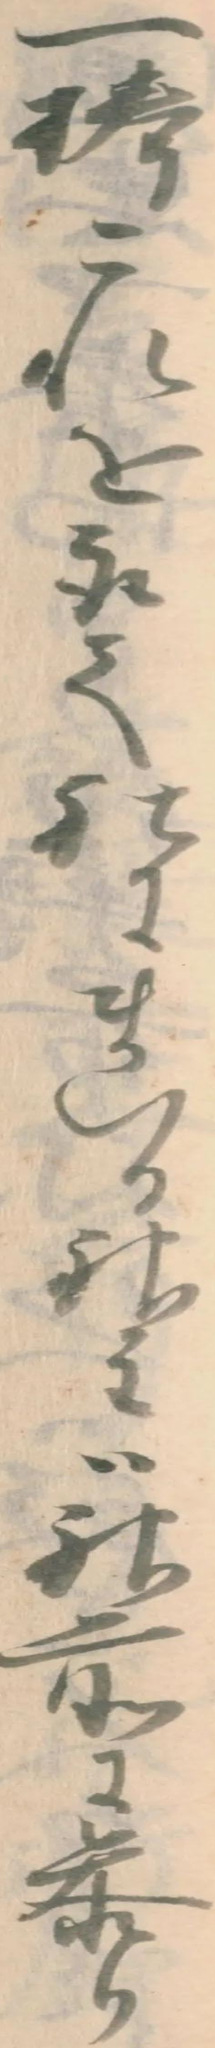一棒これを取て社にまいる神主は神前に参り
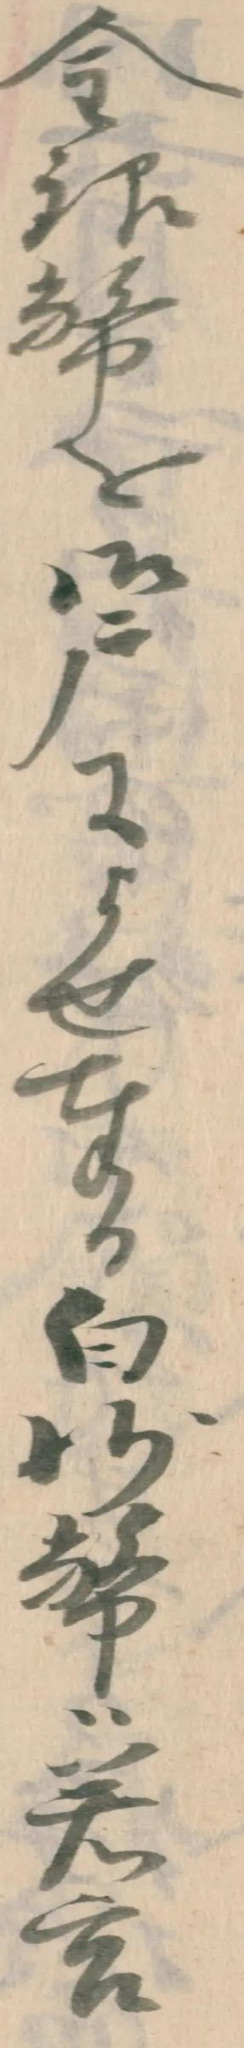金銀幣を御戸によせ奉る白妙幣は若宮
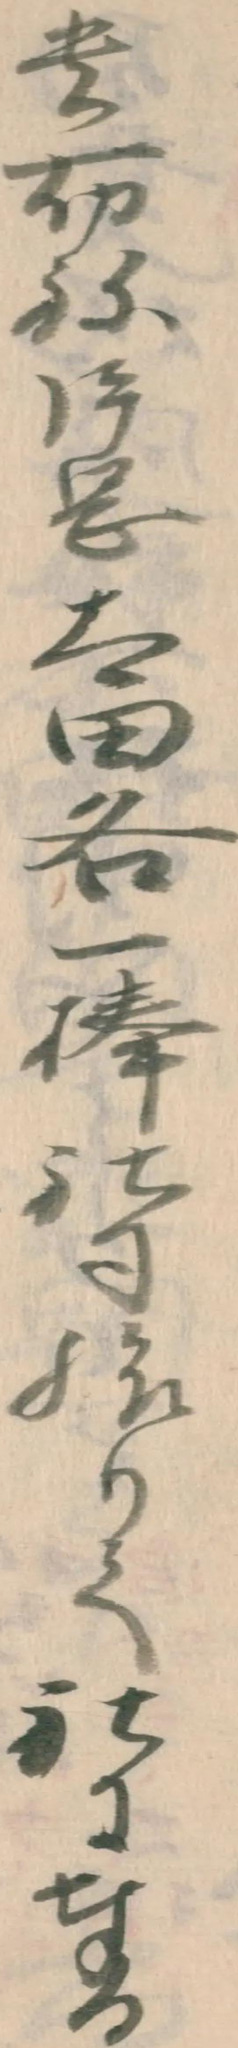貴ふね片岡太田各一棒社司給りて社に奉る
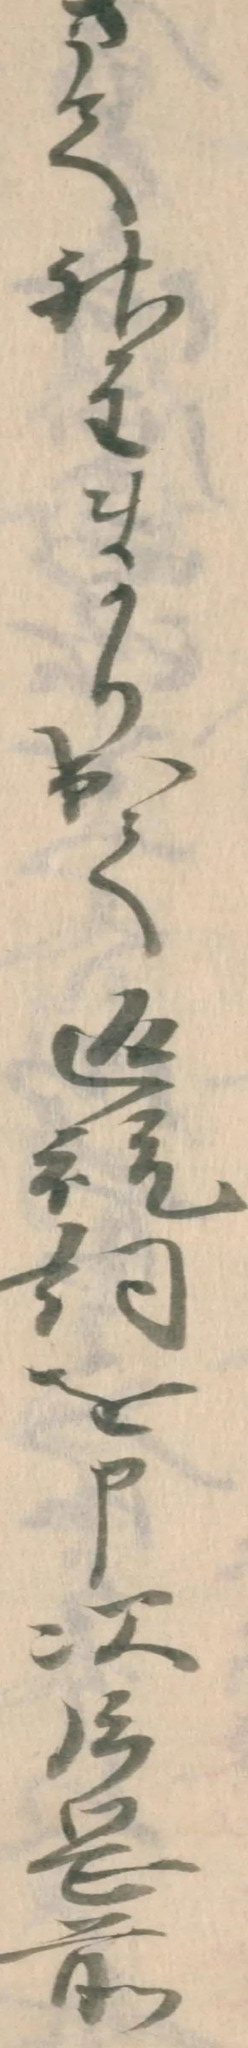さて神主まかり出て返祝詞を申次片岡前
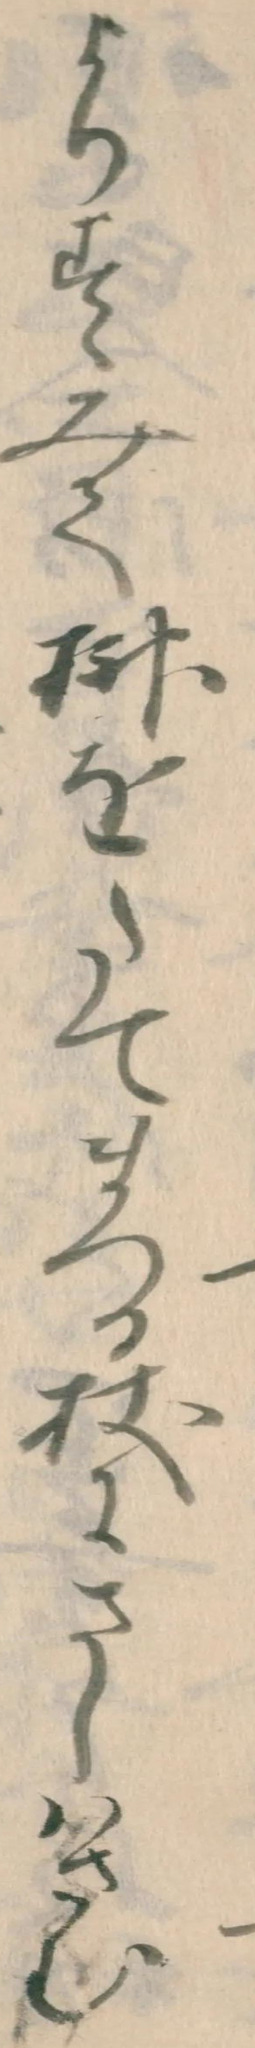よりすゝみて榊をたてまつる杖にさしはさむ
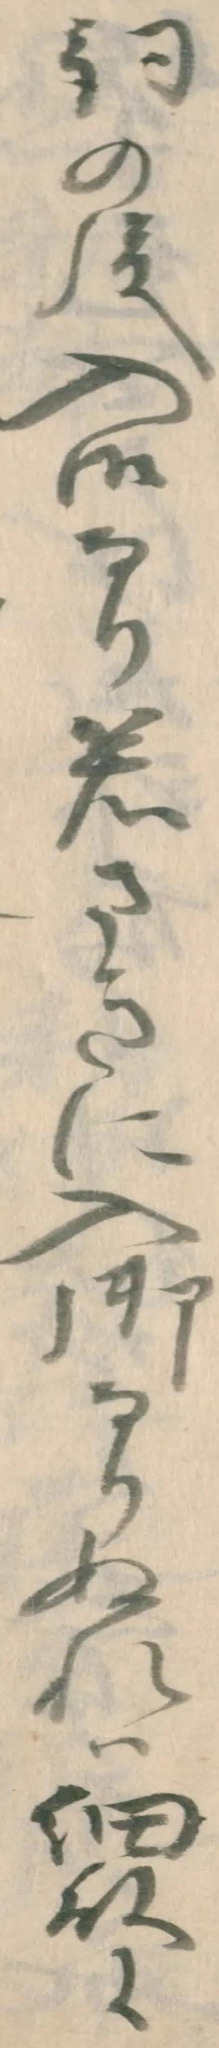詞の後入御なり若さきに入御なりぬれは細殿に
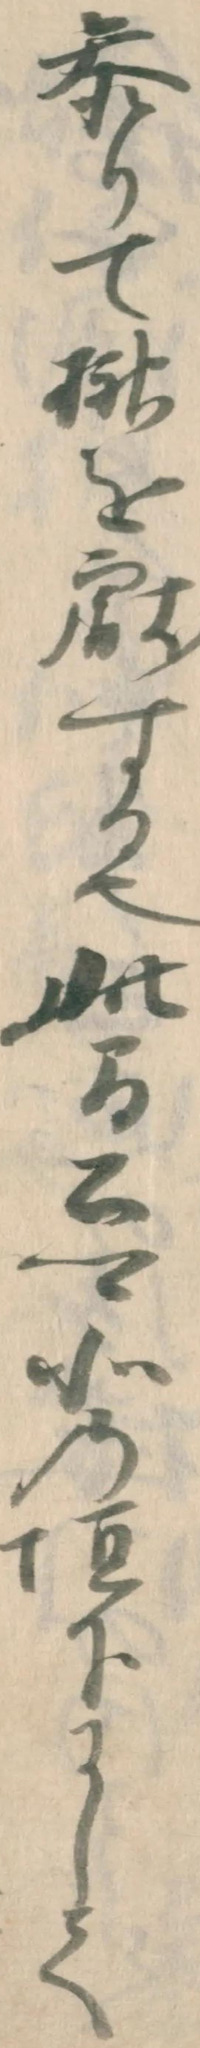参りて榊を献する也此間公卿北の垣下にして
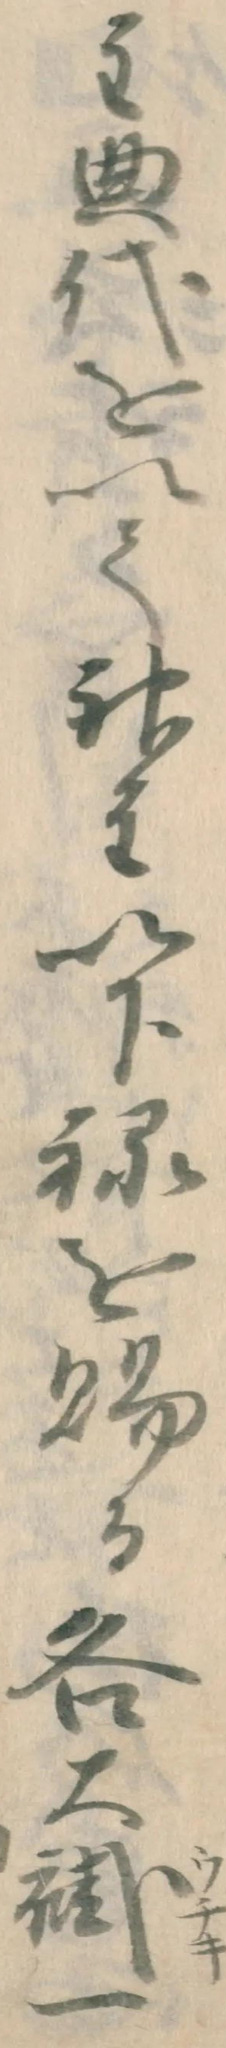主典代を以て神主以下禄を賜る各大-褂一

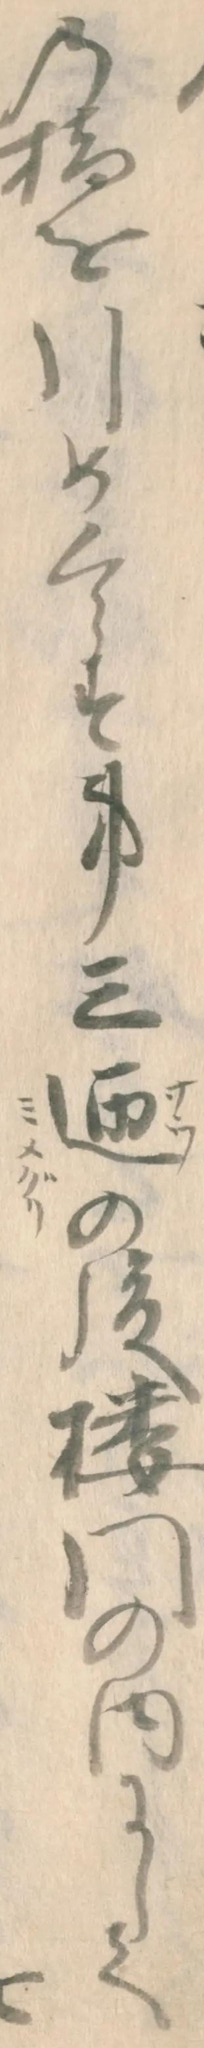の橋を引めくらす事三匝の後楼門の内にして
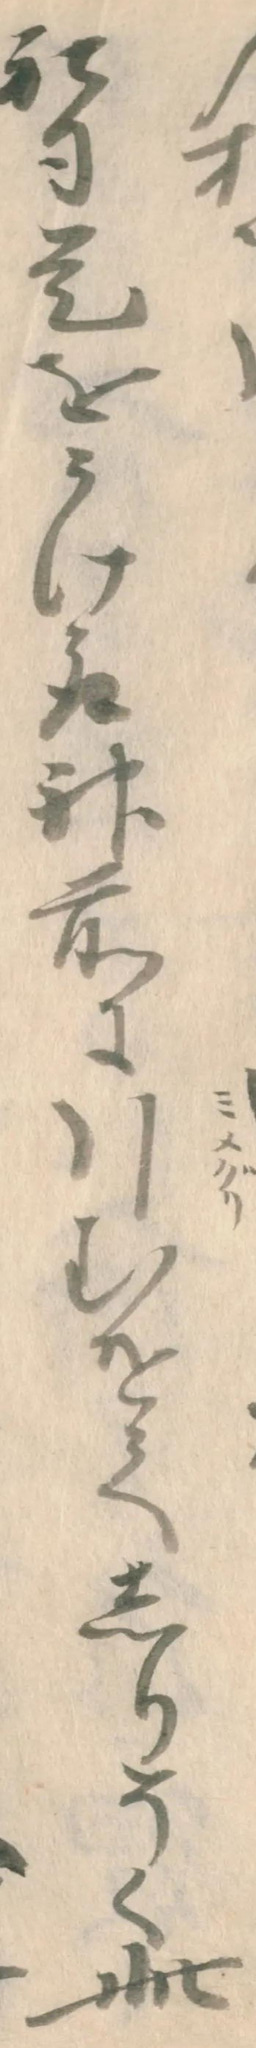社司是をうけ取神前に引むけてしりそく此
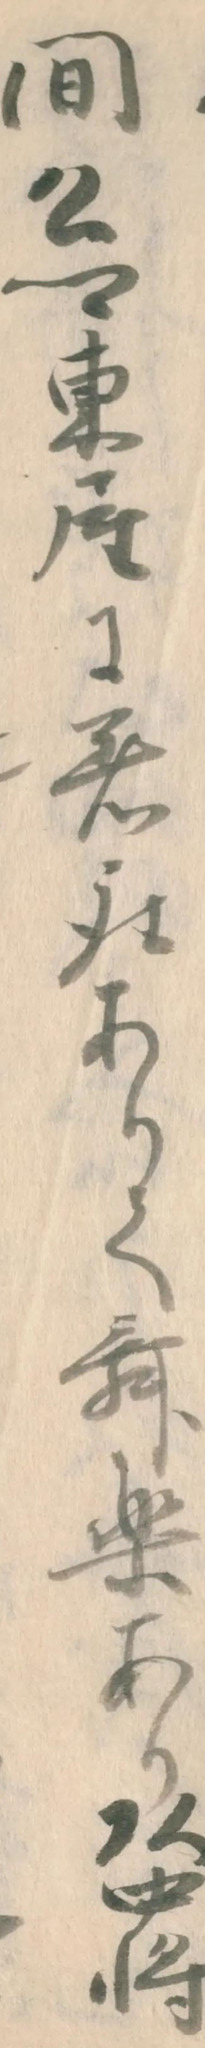間公卿東屋に着座ありて舞楽あり頭中将
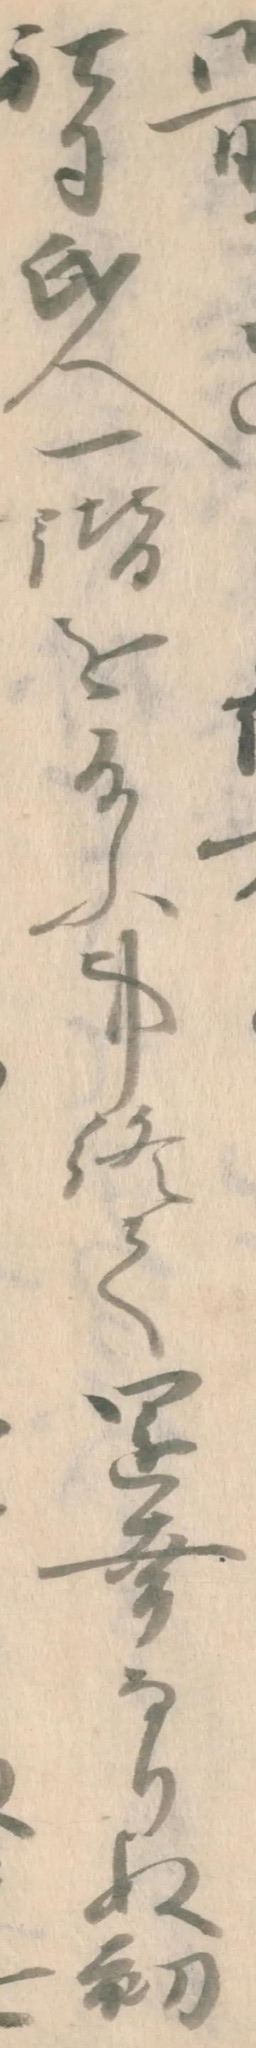社司氏人一階を給ふ事終て還幸なりぬ初
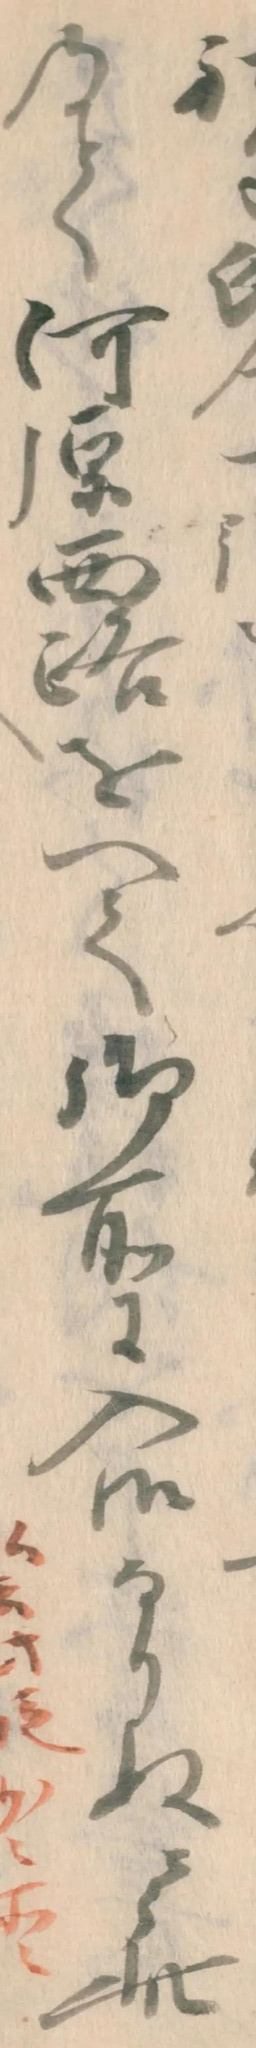のことく河原西路をへて御所に入御なりぬ云々此
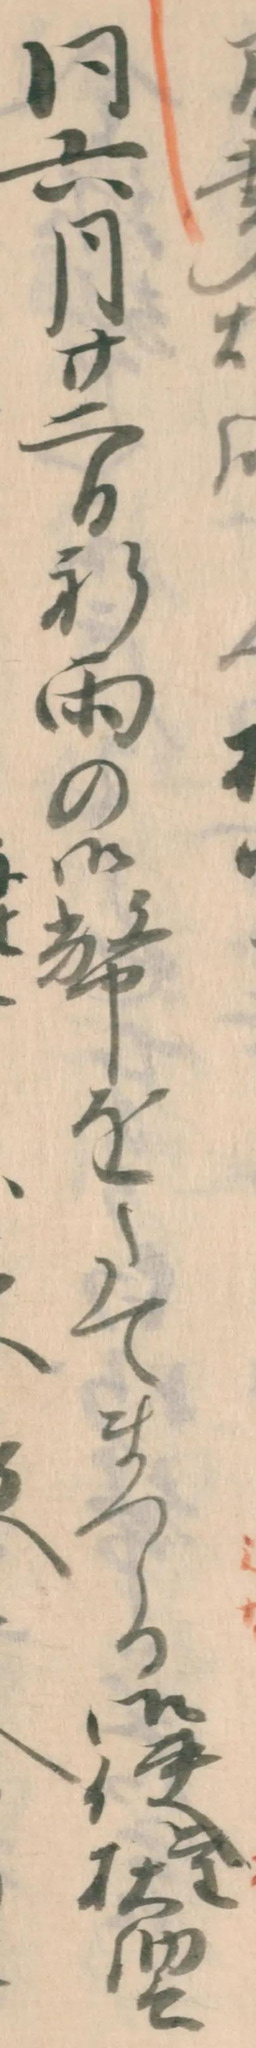同六月廿二日祈雨の御幣をたてまつらる御使権大納言
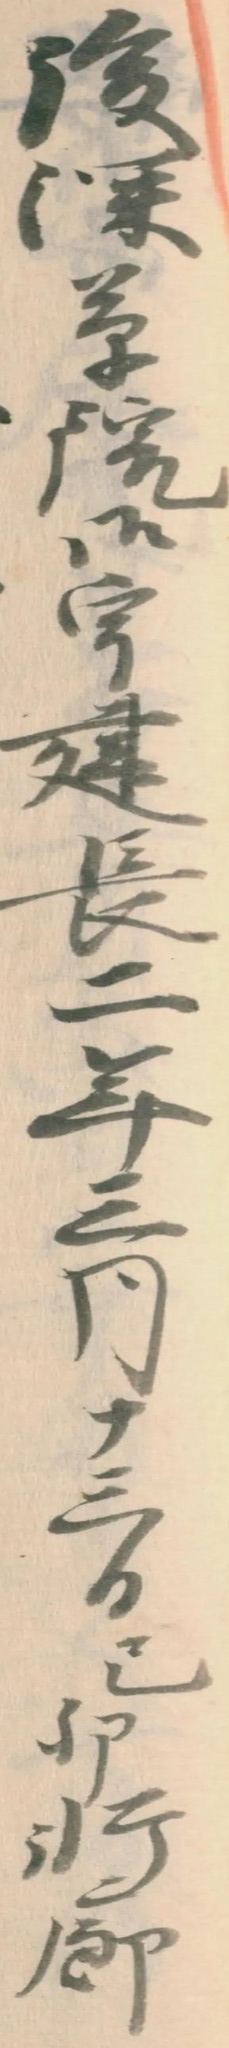後深草院御宇建長二年三月十三日己卯軒廊
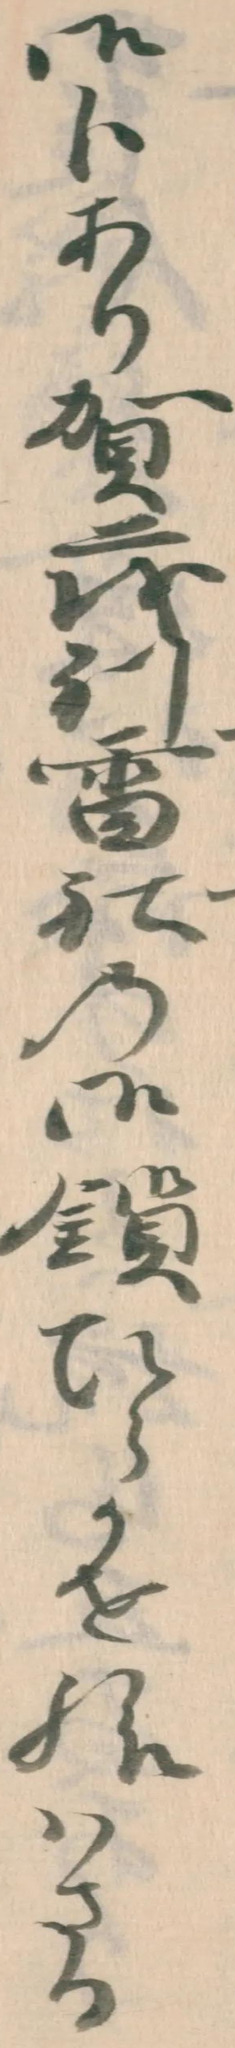御卜あり賀茂別雷社の御鎖ひらかせ給はさる
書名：賀茂社記録. 第1冊
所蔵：国立国会図書館 National Diet Library, JAPAN
